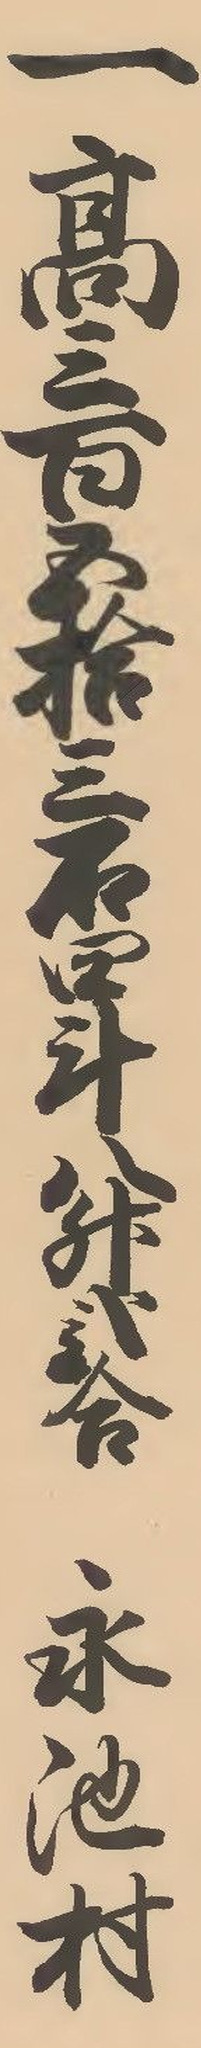一髙三百五拾三石四斗八升弐合永池村

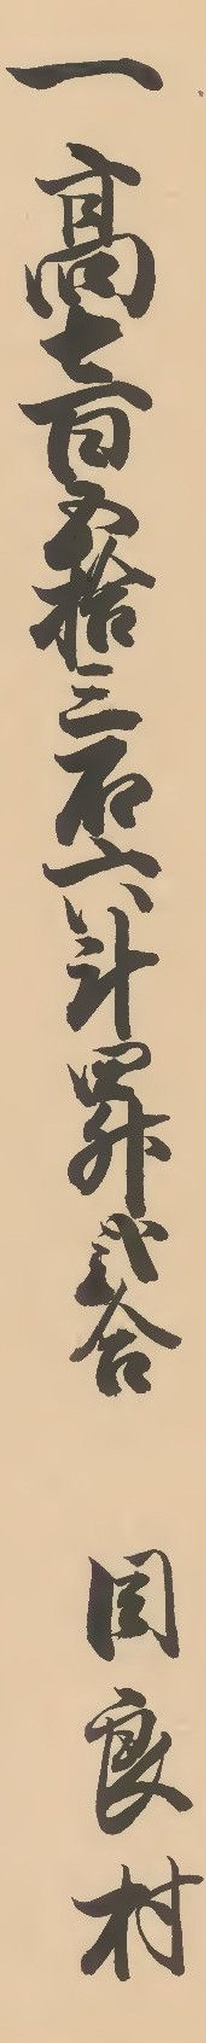一髙七百五拾三石六斗四升弐合目良村
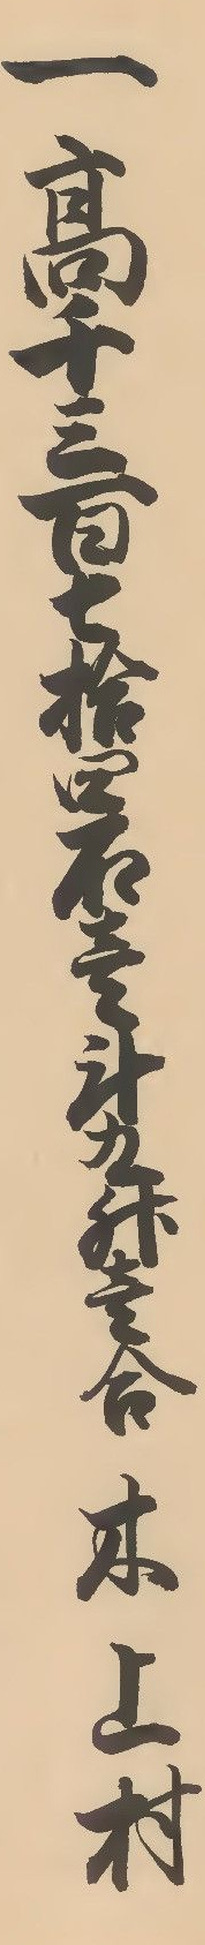一髙千三百七拾四石壱斗九升壱合木上村
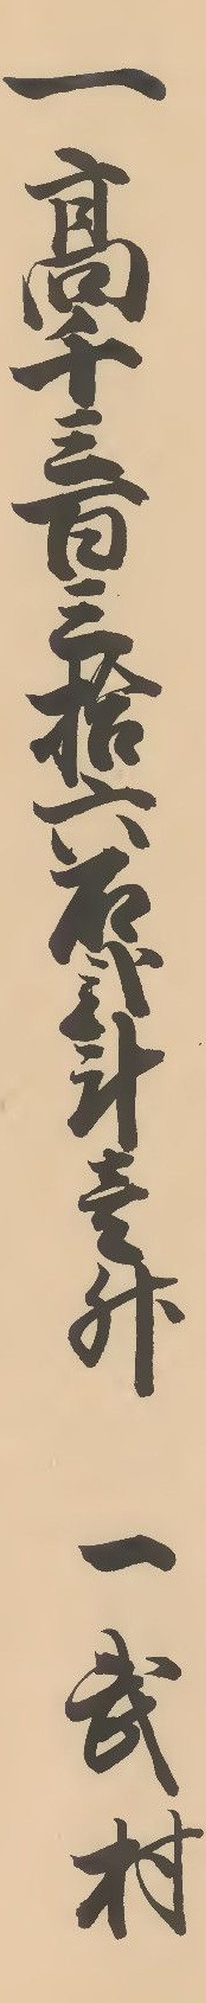一髙千三百三拾六石弐斗壱升一武村
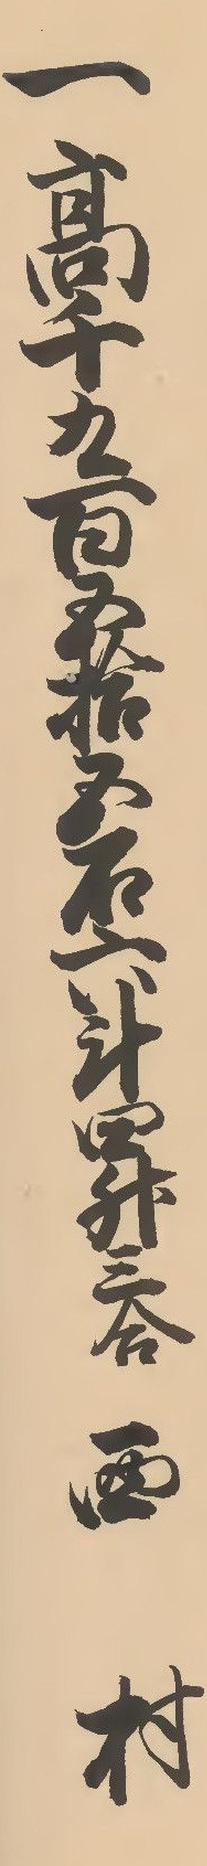一髙千九百五拾五石六斗四升三合西村
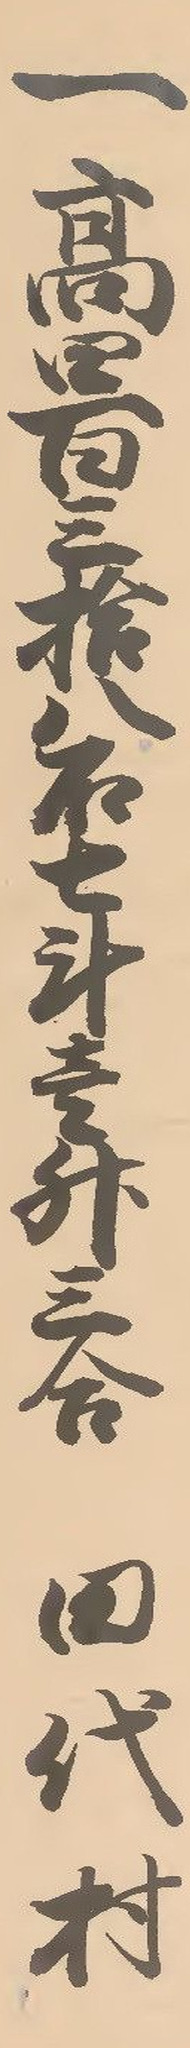一髙四百三拾八石七斗壱升三合田代村
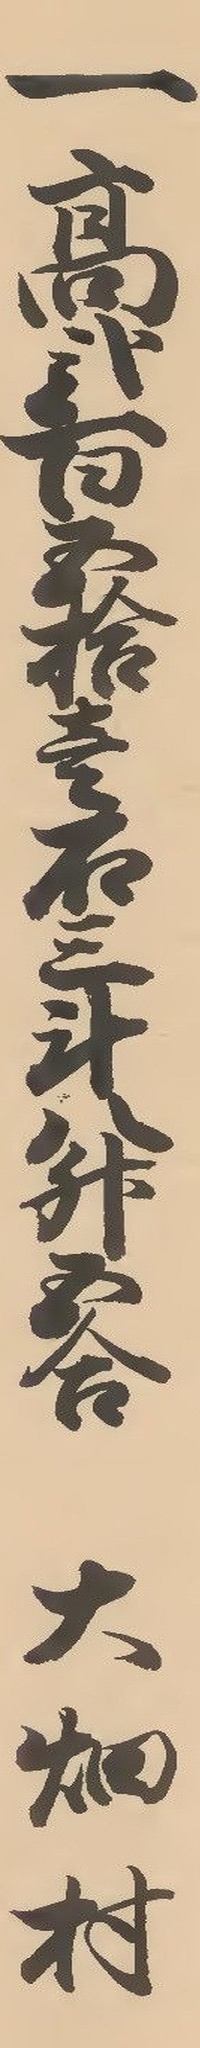一髙弐百五拾壱石三斗八升五合大畑村
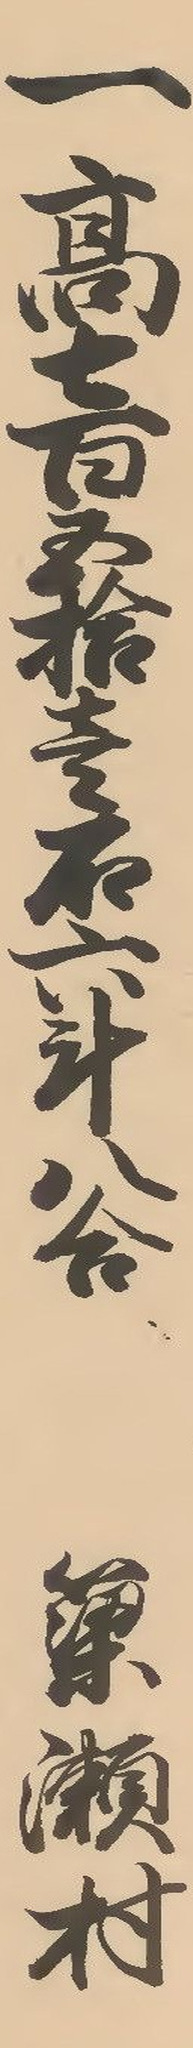一髙七百五拾壱石六斗八合葉瀬村
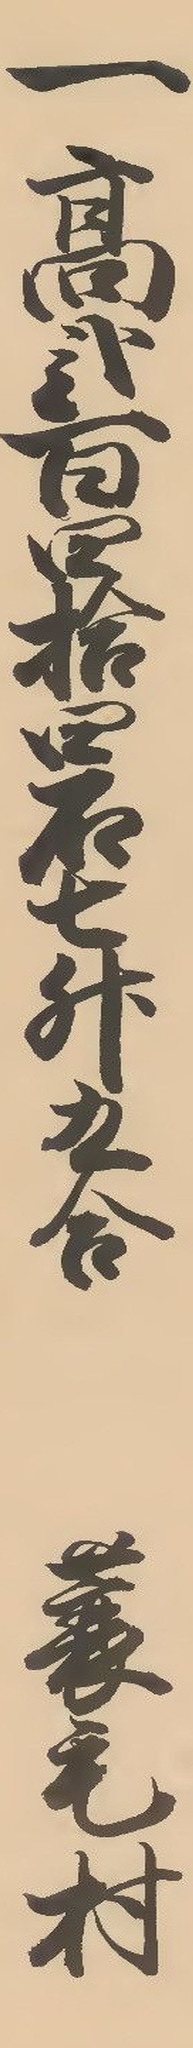一髙弐百四拾四石七升九合毛村

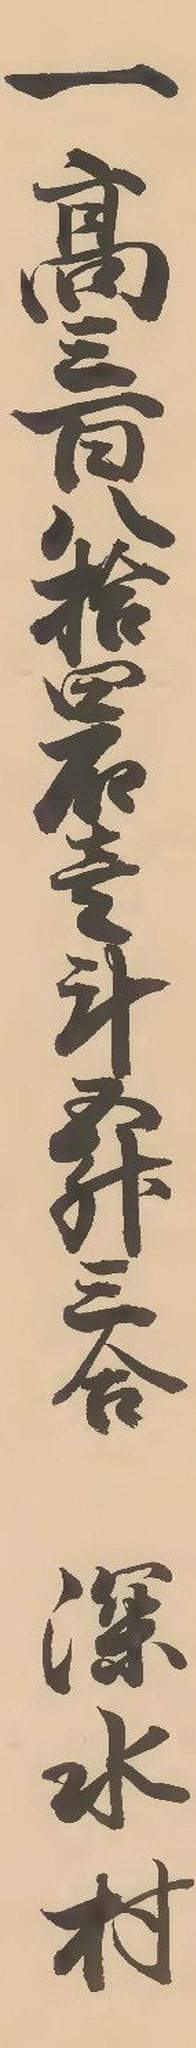一髙三百八拾四石壱斗五升三合深水村
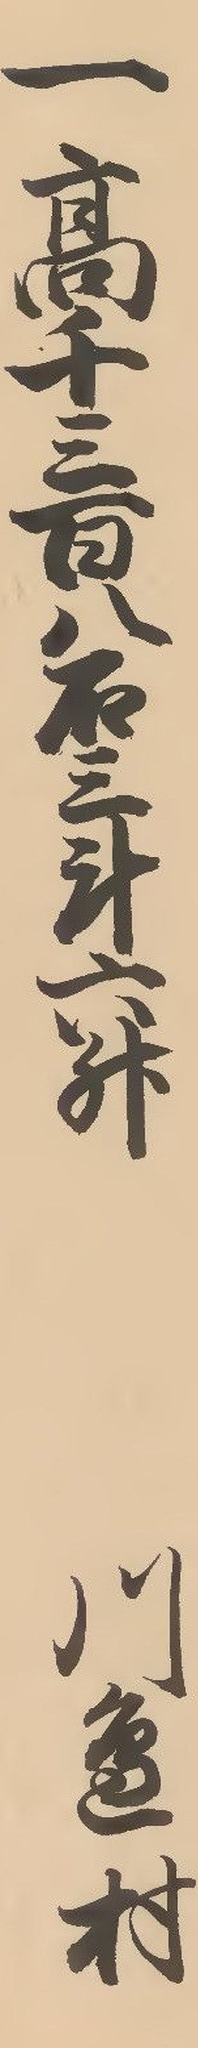一髙千三百八石三斗六升川邊村
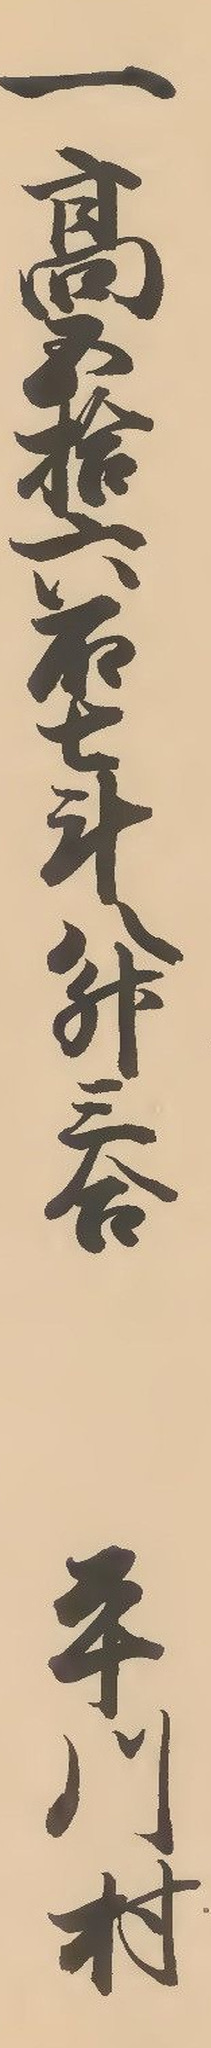一髙五拾六石七斗八升三合平川村
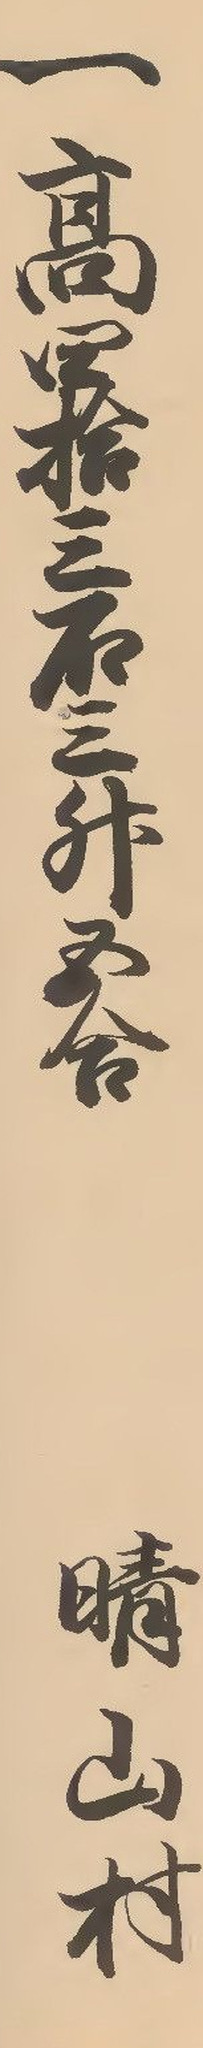一髙四拾三石三升五合晴山村
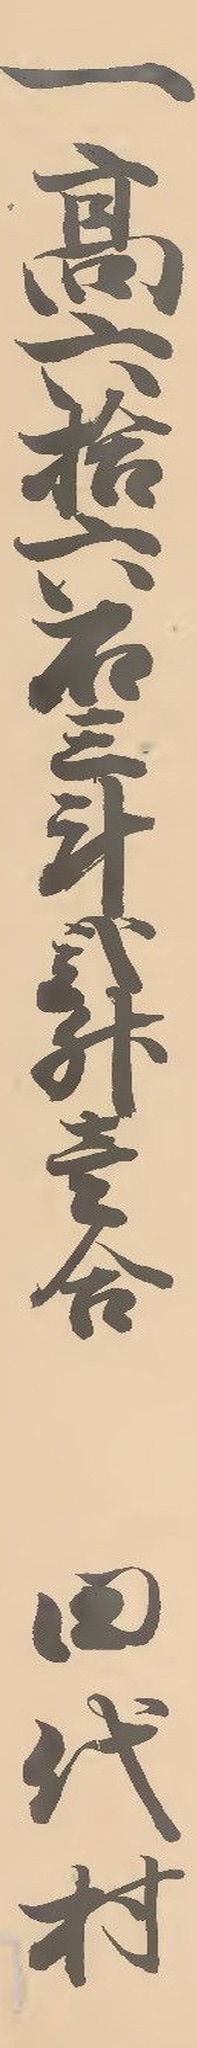一髙六拾六石三斗弐升壱合田代村
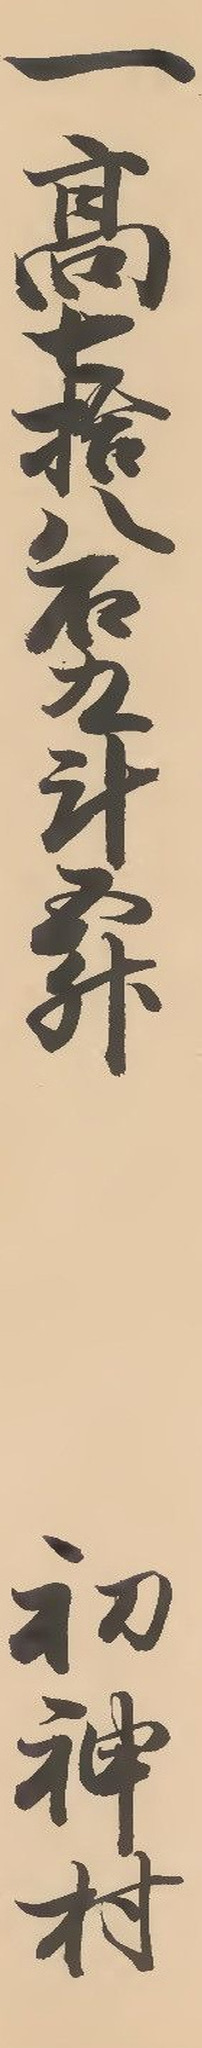一髙七拾八石九斗五升初神村
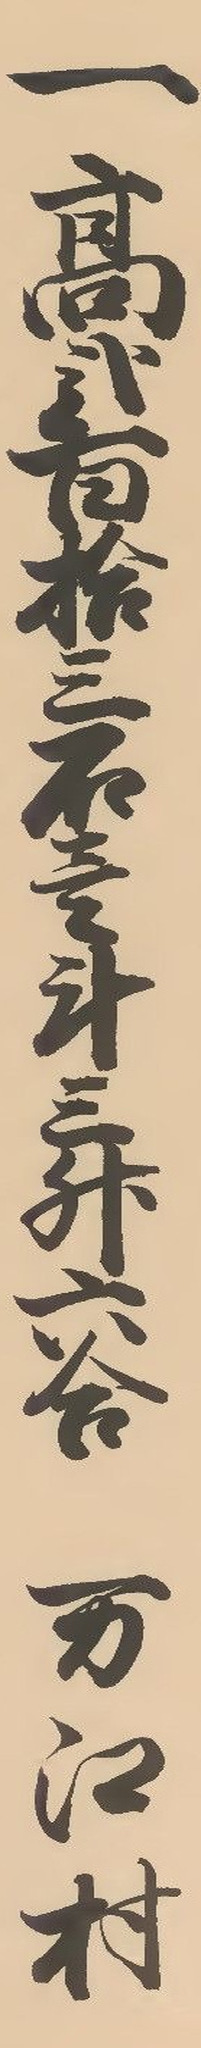一髙弐百拾三石壱斗三升六合万江村
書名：肥後国郷帳
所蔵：国立公文書館 National Archives of Japan
